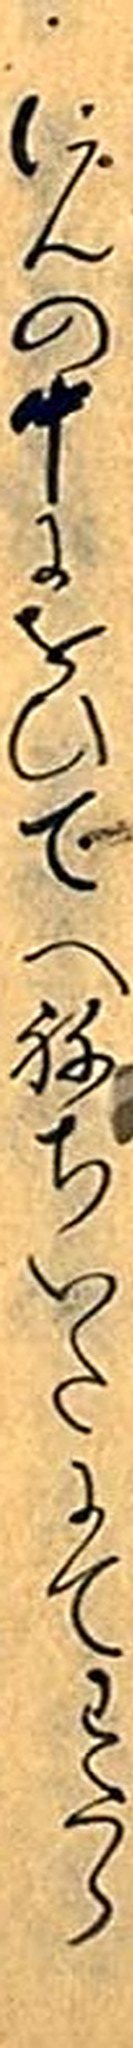にんの中にをひてへねちいたにてわたら
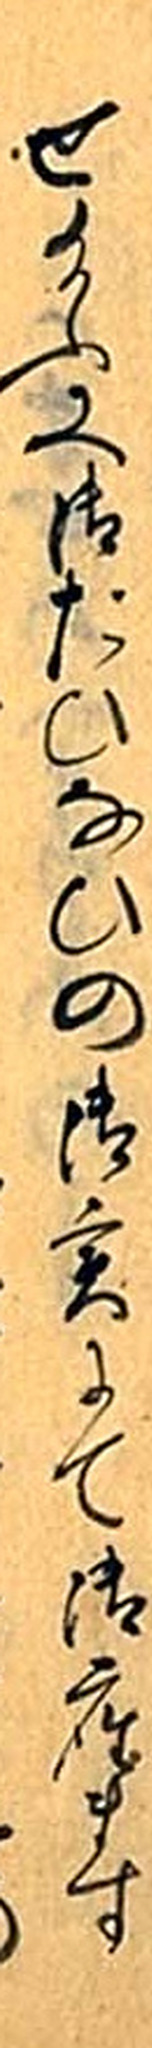せ給ふ又御たひなひの御実にて御座ます
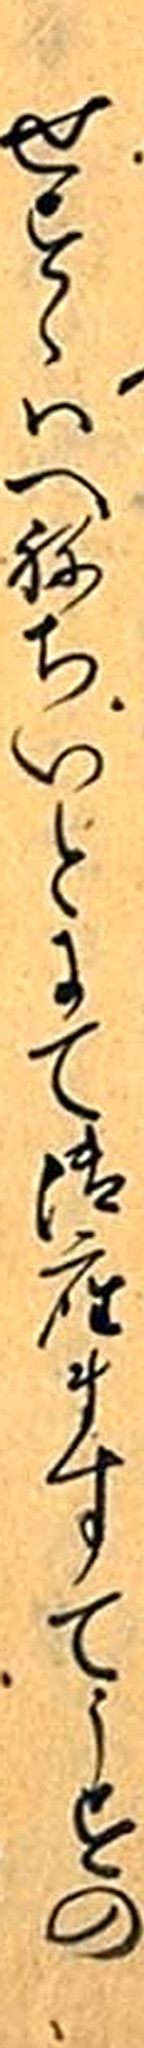せすゝはへねちいとにて御座ますてうすの
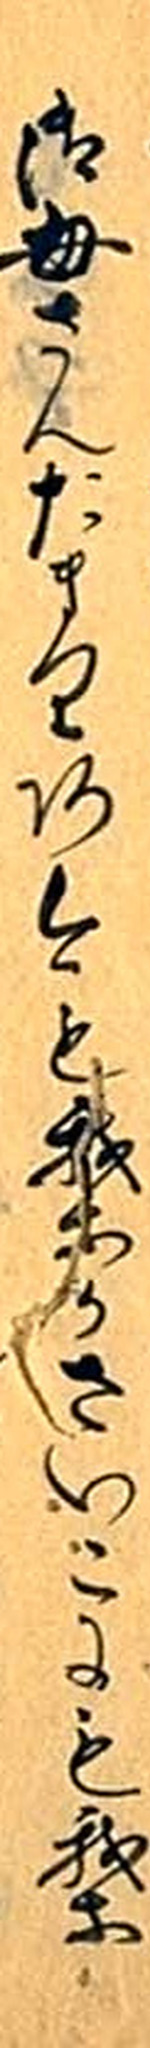御母さんたまりあ今も我等かさいこにも我等
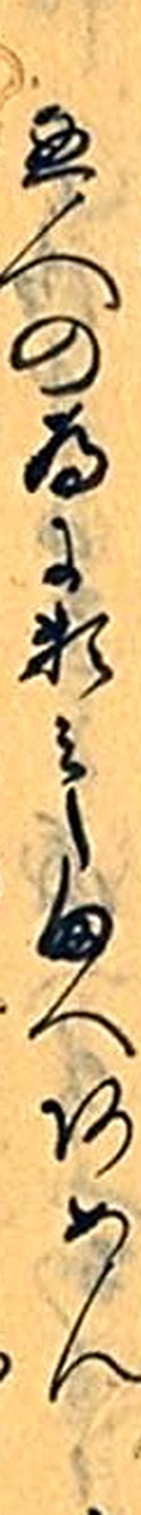悪人の為に頼みたまへあめん
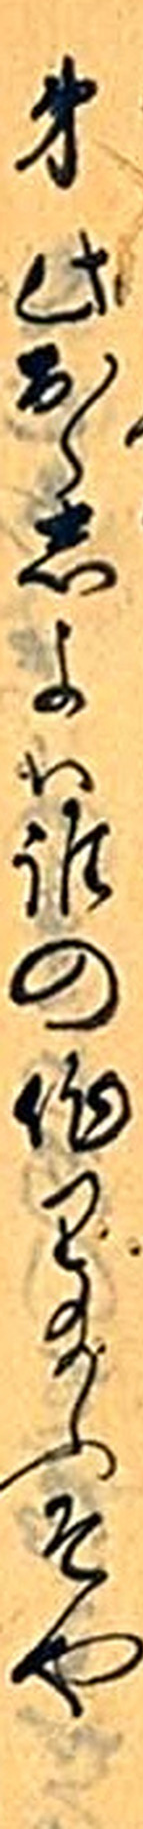弟此おらしよは誰の作り給ふそや
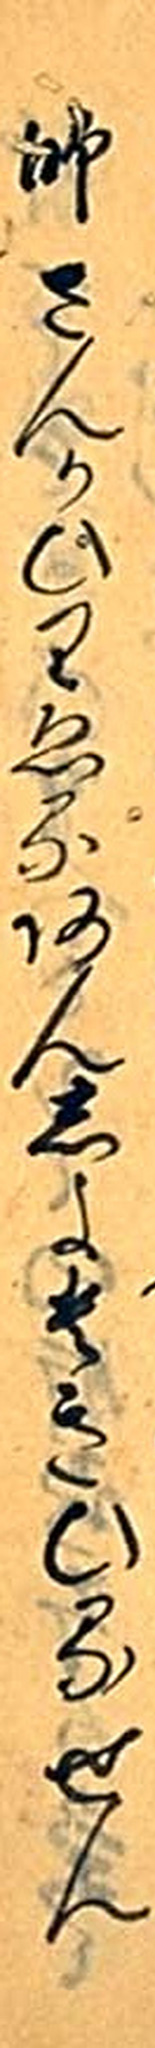師さんかひりゑるあんしよ貴きひるせん
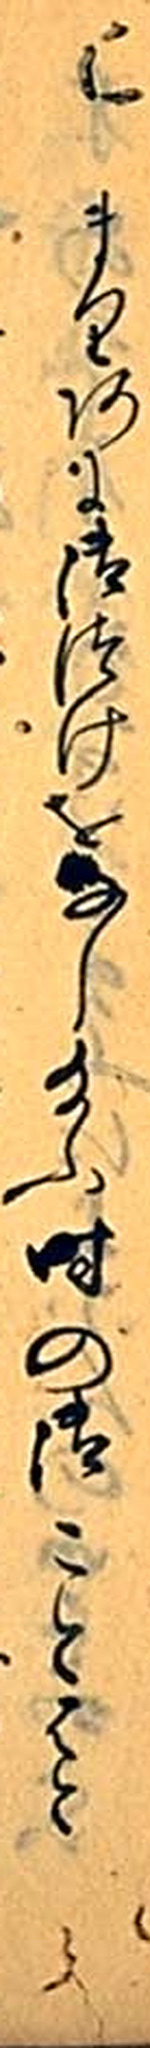まりあに御つけをなし給ふ時の御ことはと
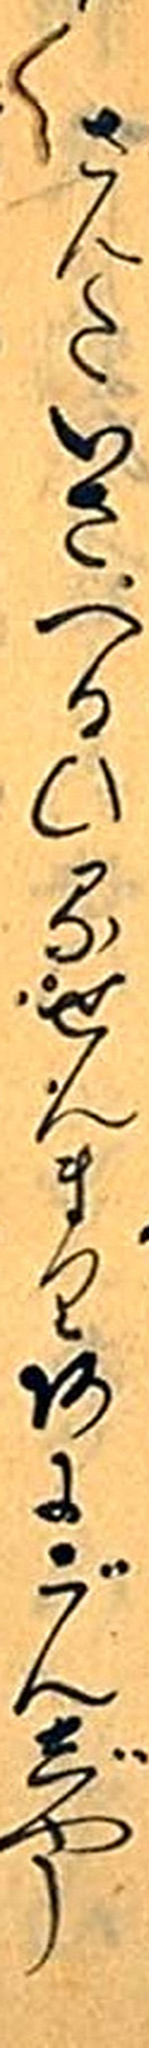さんたいさへるひるせんまりあにごんじやう
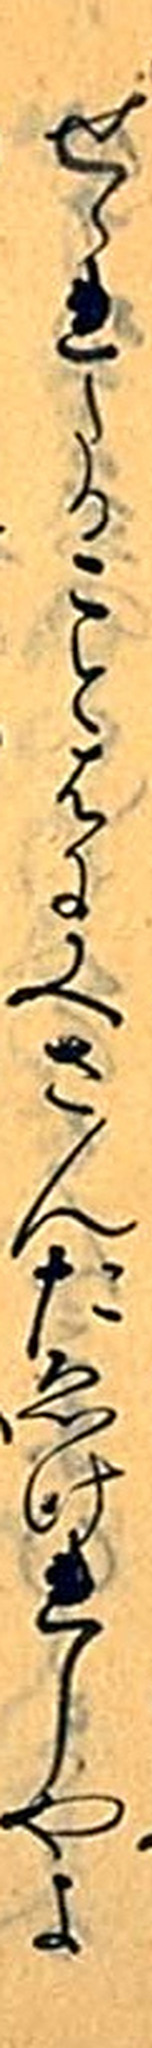せられたることはに又さんたゑけれしやよ
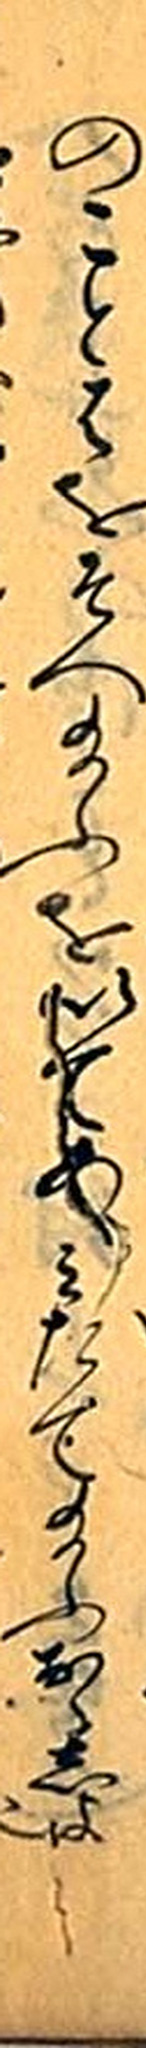のことはをそへ給ふを以てあみたて給ふおらしよ也
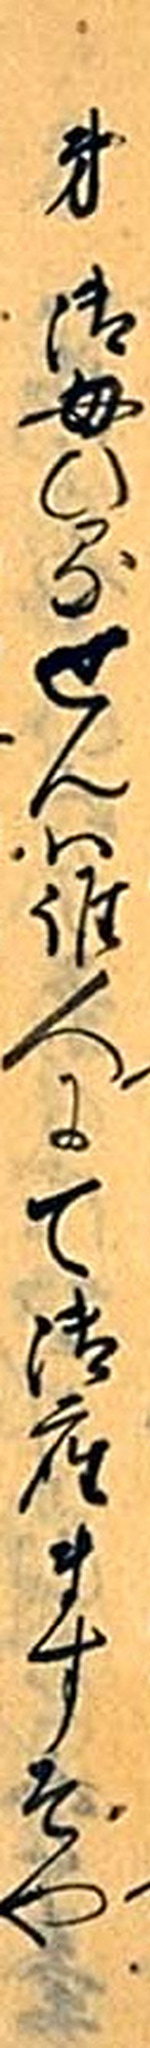弟御母ひるせんは誰人にて御座ますそや
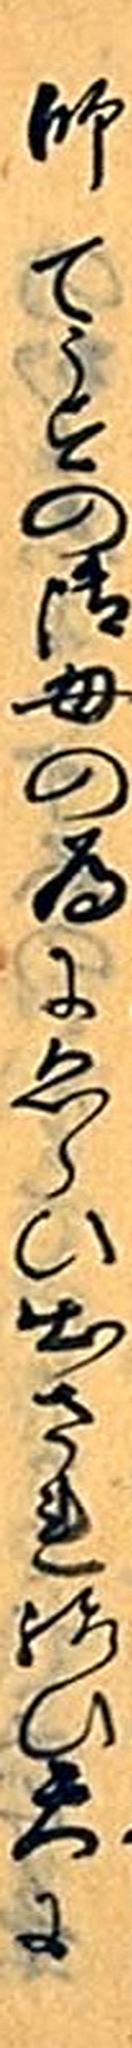師てうすの御母の為にゑらひ出され給ひ天に
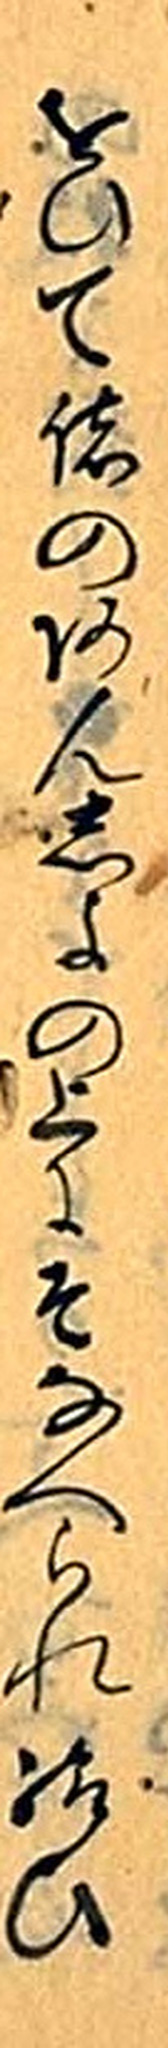をひて諸のあんしよの上にそなへられ給ひ
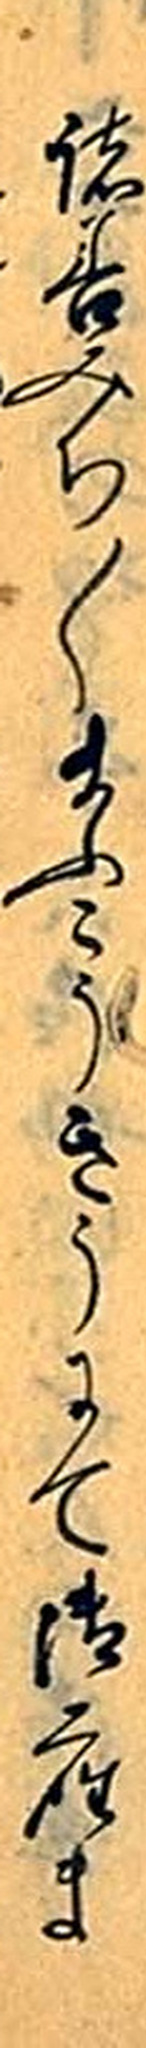諸善みち〳〵給ふこうきうにて御座ま
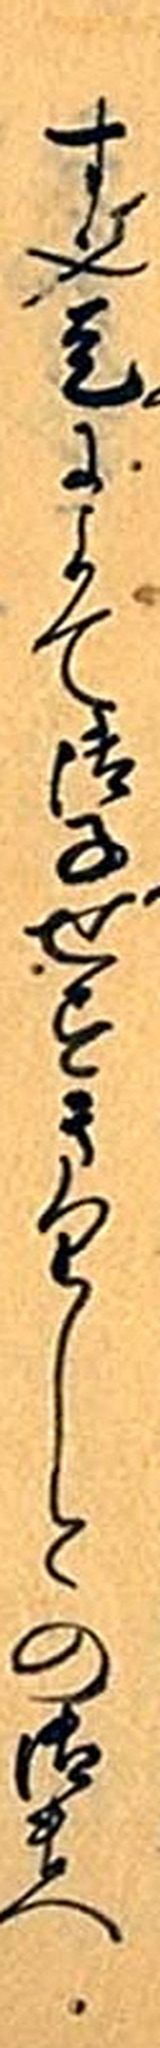す也是によて御子せすきりしとの御まへ
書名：ドチリナ・キリシタン
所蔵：東京大学総合図書館 / General Library in the University of Tokyo
